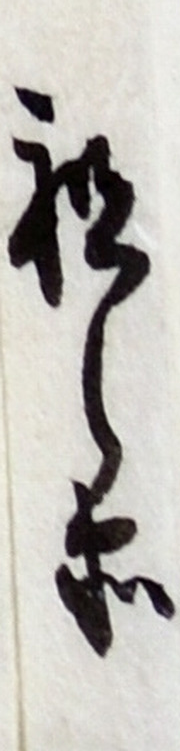七兵衛
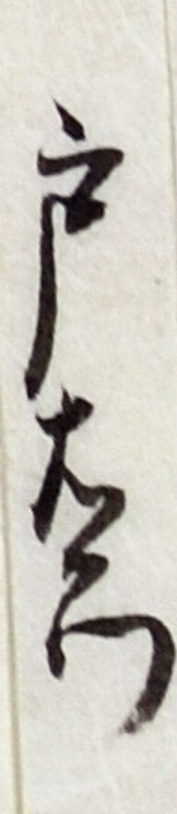兵右衛門
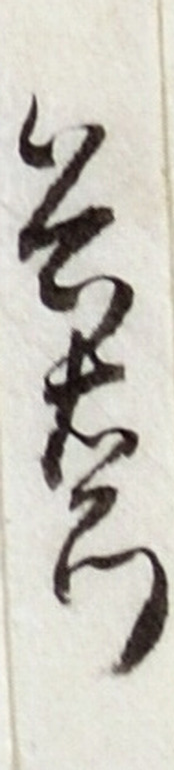兵右衛門
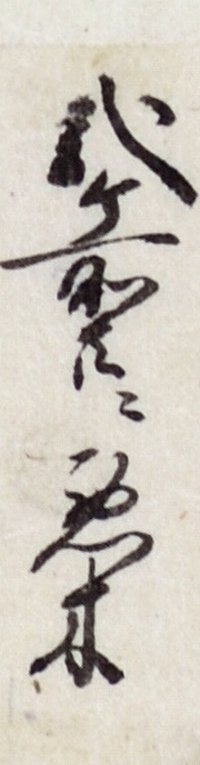弐ケ所共ニ悪木
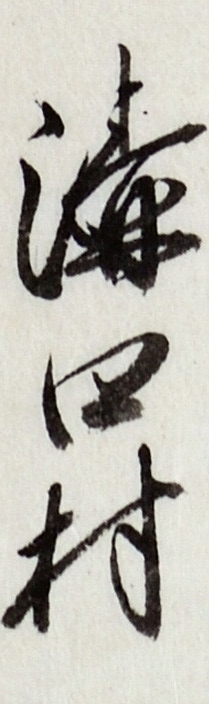溝口村
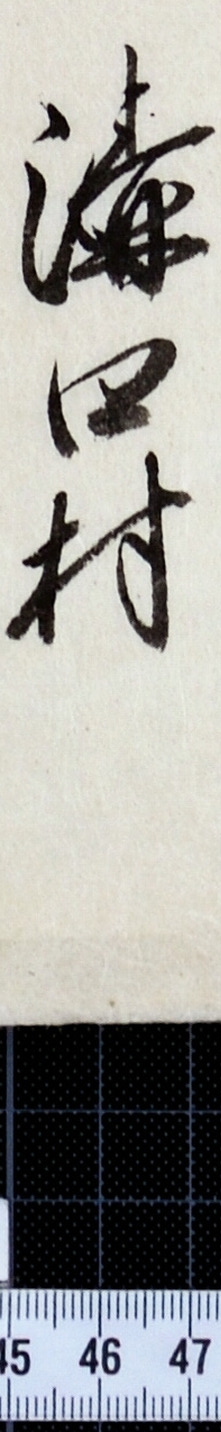溝口村
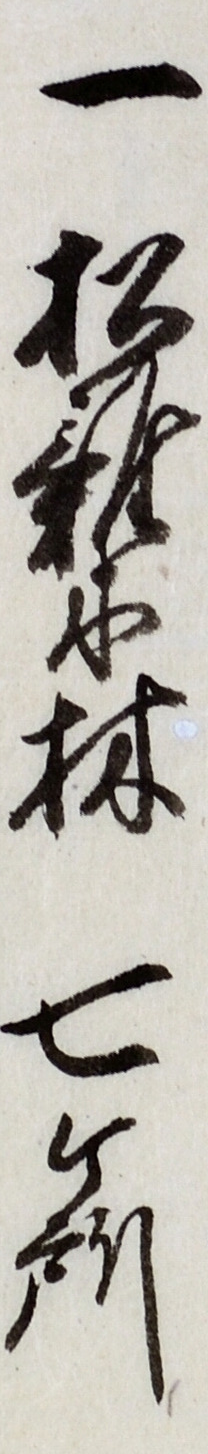一松雑木林七ケ所
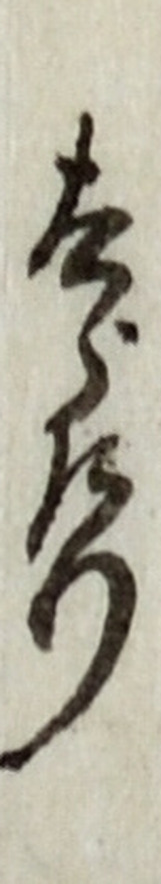太郎左衛門
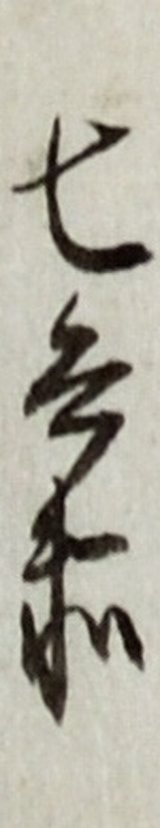七兵衛
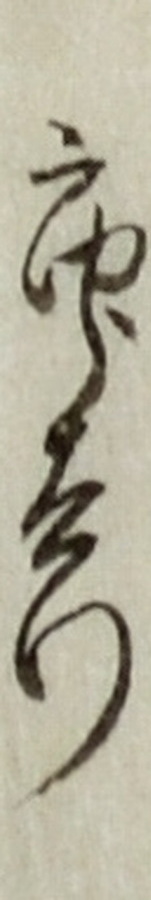七兵衛

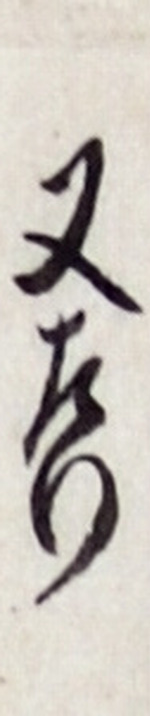茂左衛門
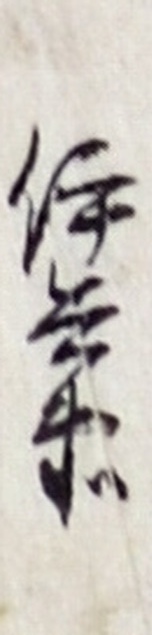新兵衛
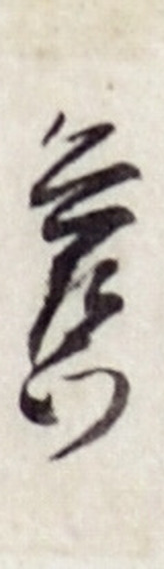茂左衛門
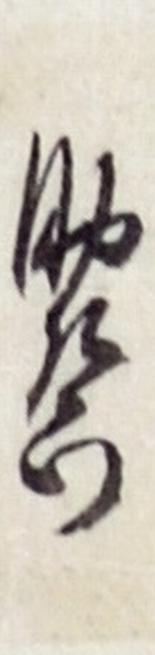茂左衛門
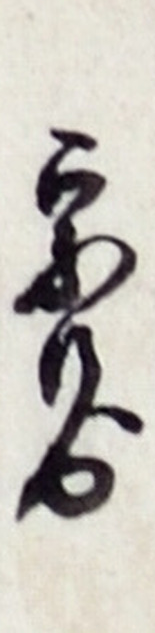作右衛門
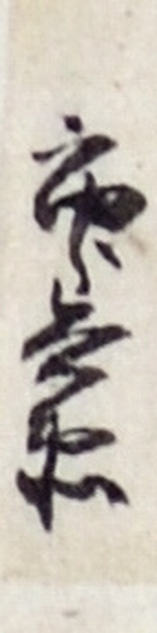新兵衛
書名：御領分中御林御藪附帳
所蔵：伊那市立高遠町図書館・合同会社AMANE
